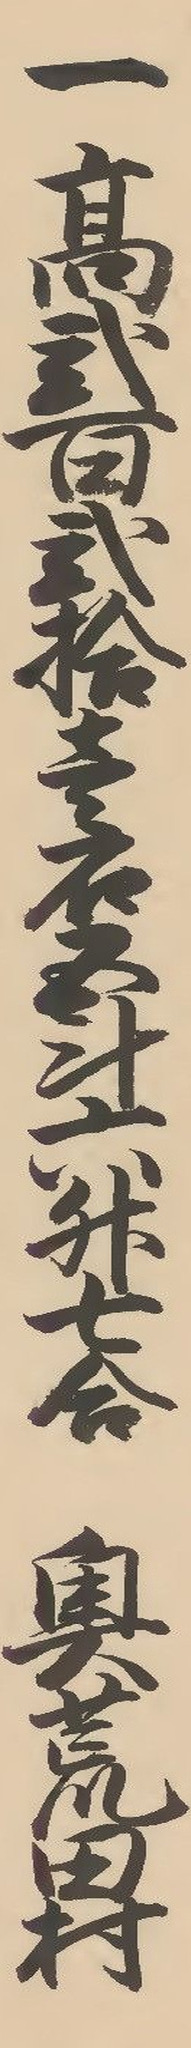一髙弐百弐拾壱石五斗六升七合奥荒田村

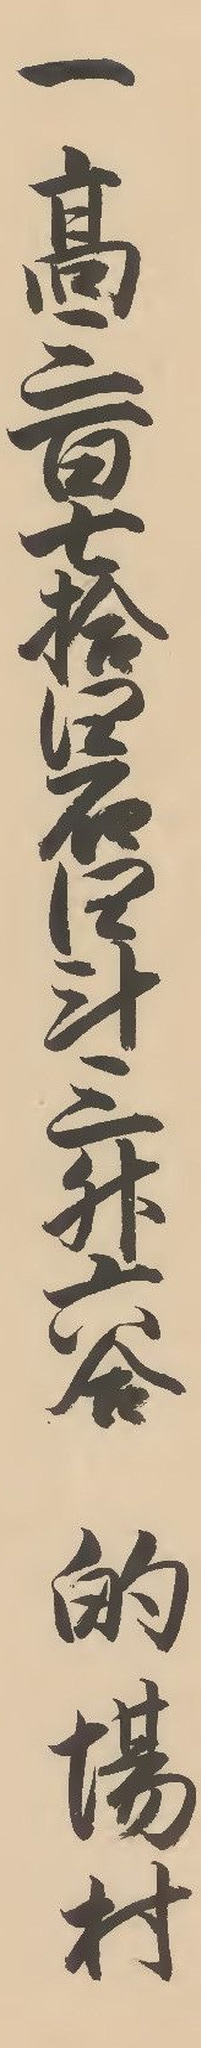一髙三百七拾四石四斗三升六合的場村
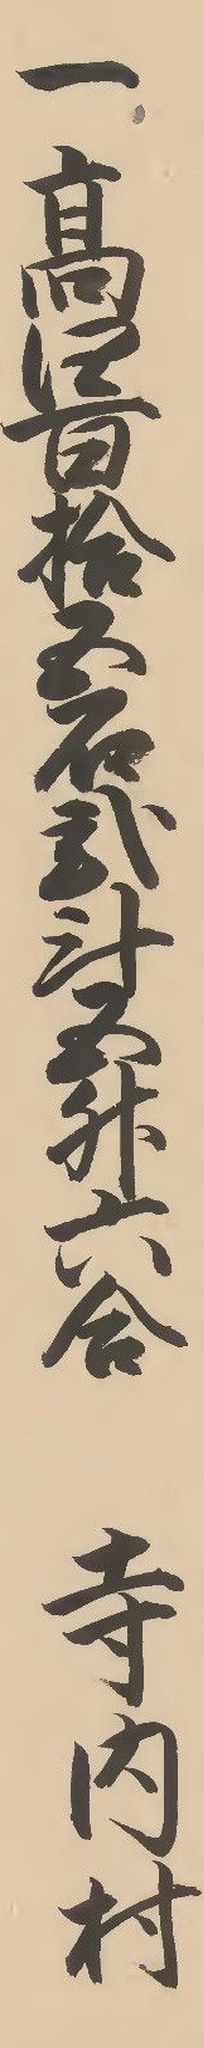一髙四百拾五石弐斗五升六合寺内村
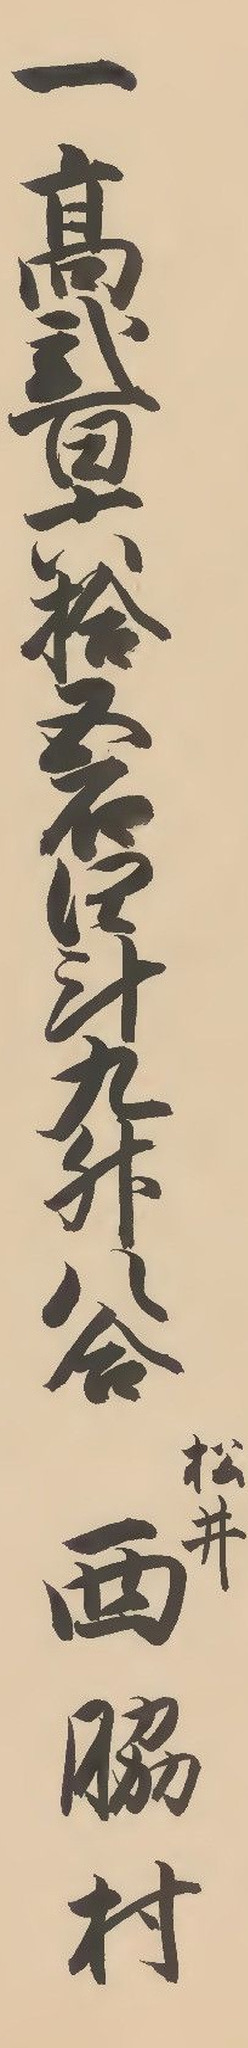一髙弐百六拾五石四斗九升八合西脇村
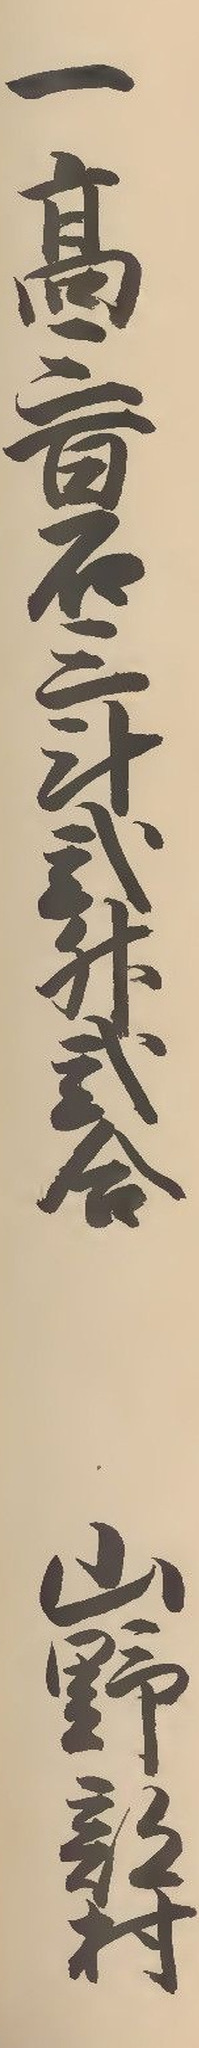一髙三百石三斗弐升弐合山野部村
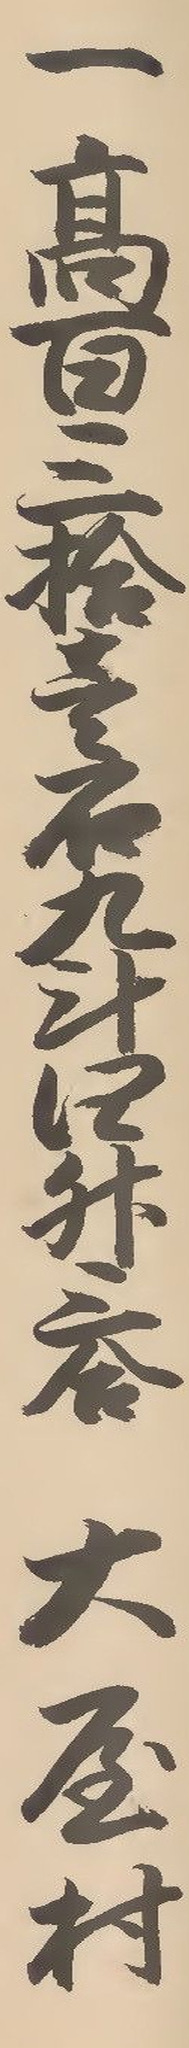一髙百三拾壱石九斗四升三合大屋村
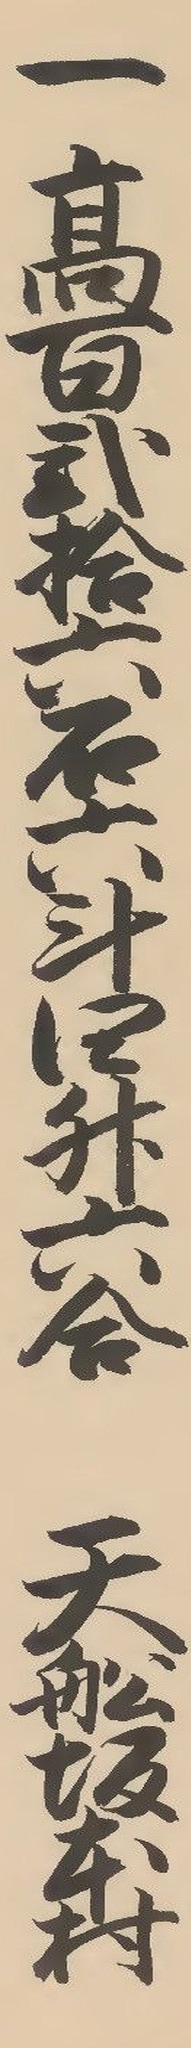一髙百弐拾六石六斗四升六合天舩坂本村
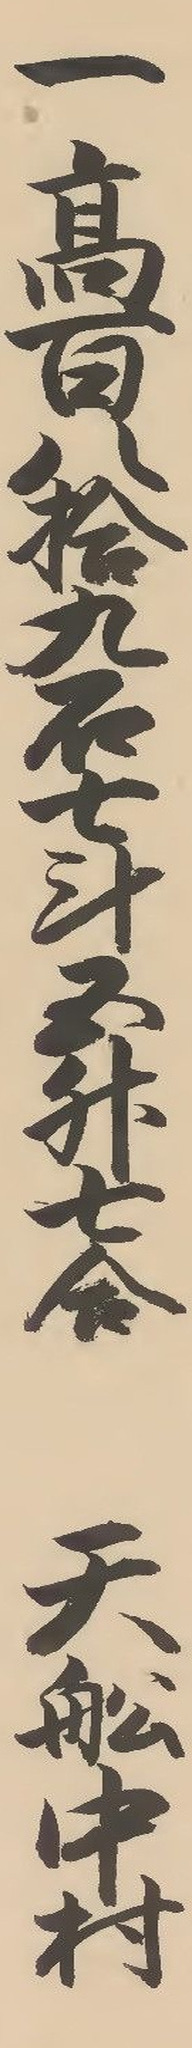一髙百八拾九石七斗五升七合天舩中村
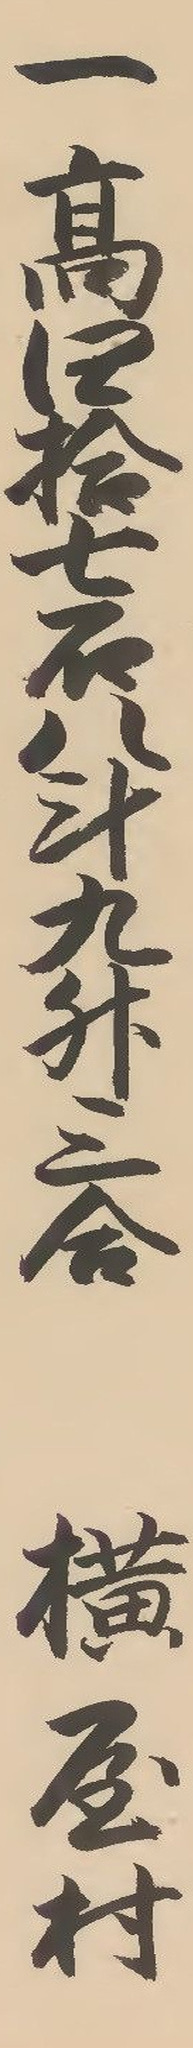一髙四拾七石八斗九升三合横屋村

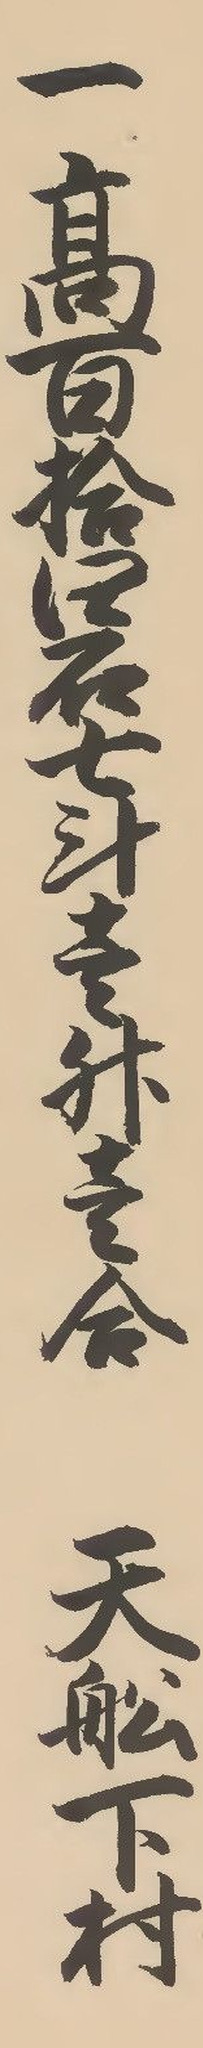一髙百拾四石七斗壱升壱合天舩下村
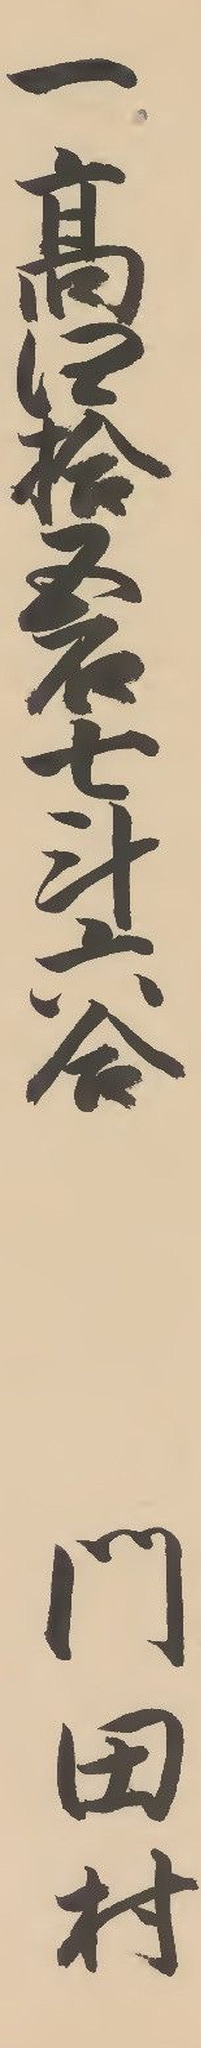一髙四拾五石七斗六合門田村
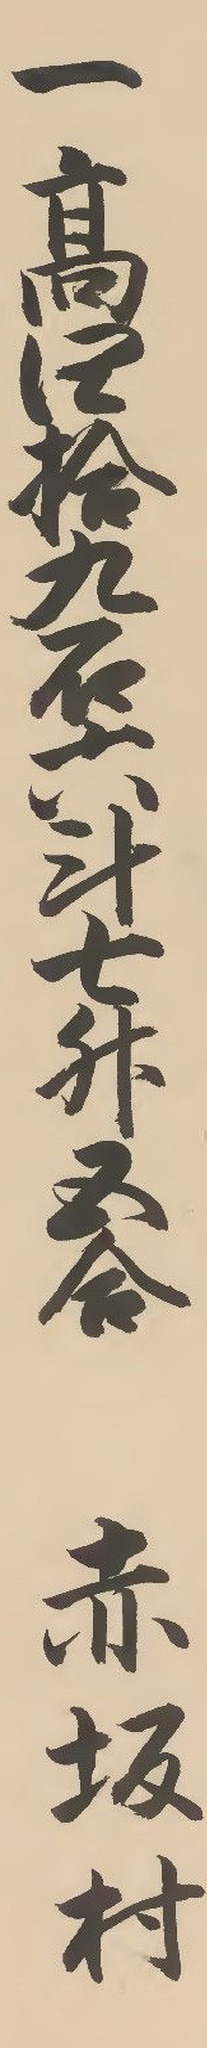一髙四拾九石六斗七升五合赤坂村
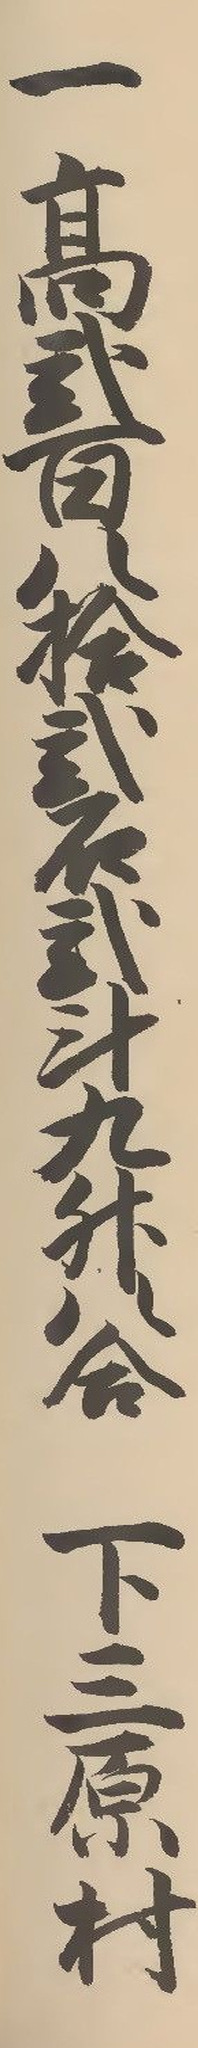一髙弐百八拾弐石弐斗九升八合下三原村
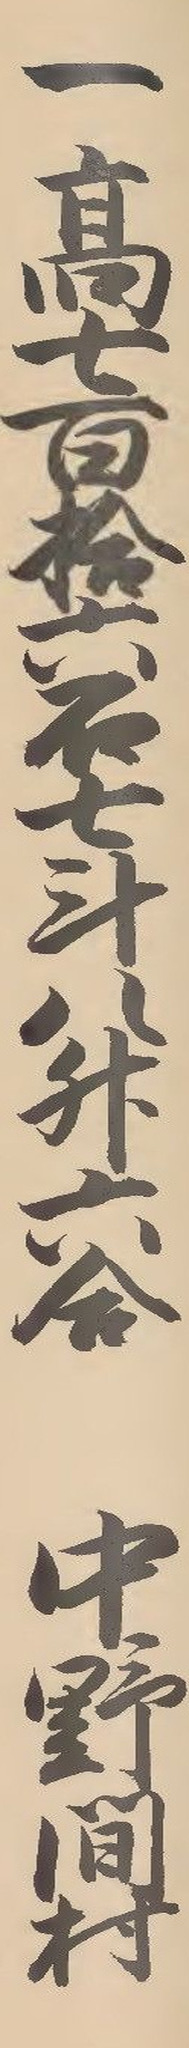一髙七百拾六石七斗八升六合中野間村
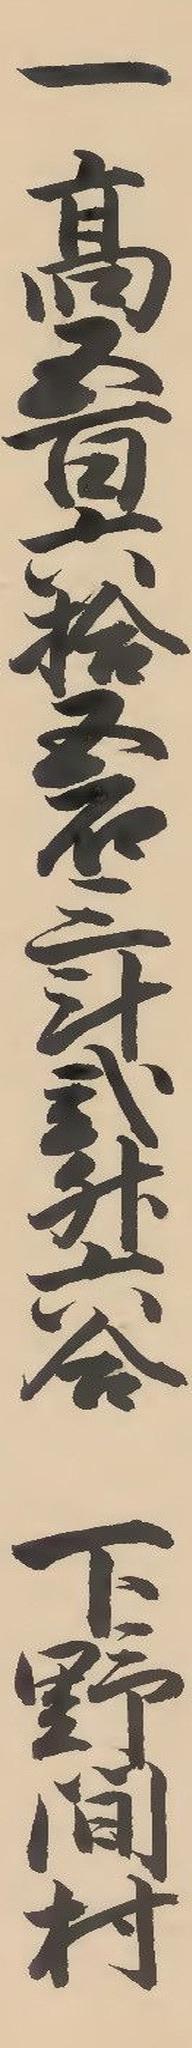一髙五百六拾五石三斗弐升六合下野間村
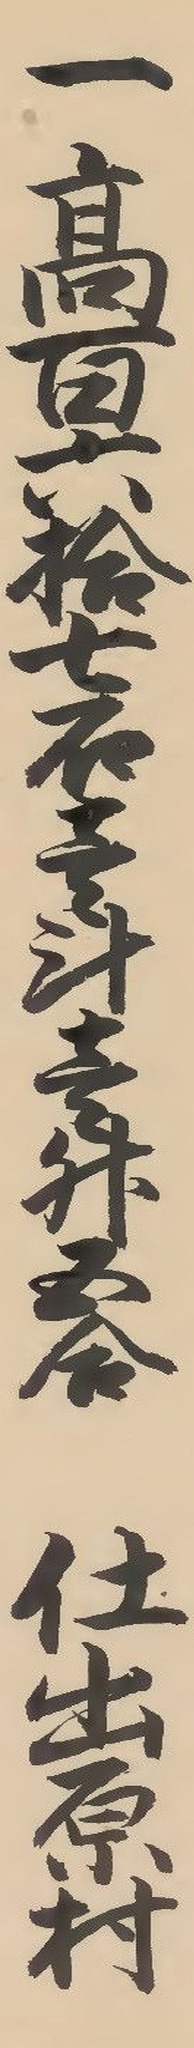一髙百六拾七石壱斗壱升五合仕出野原
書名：播磨国郷帳
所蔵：国立公文書館 National Archives of Japan
